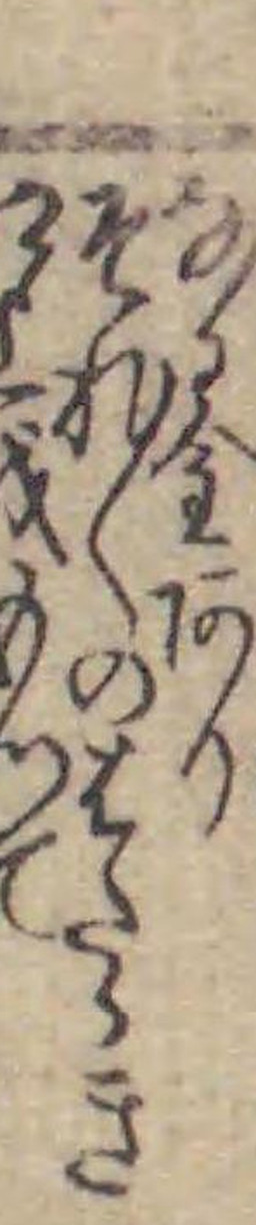それ〳〵のはたらき
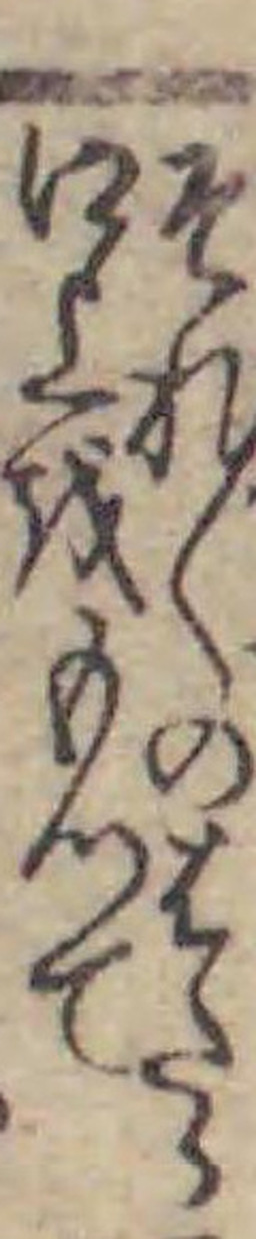口上をもつて
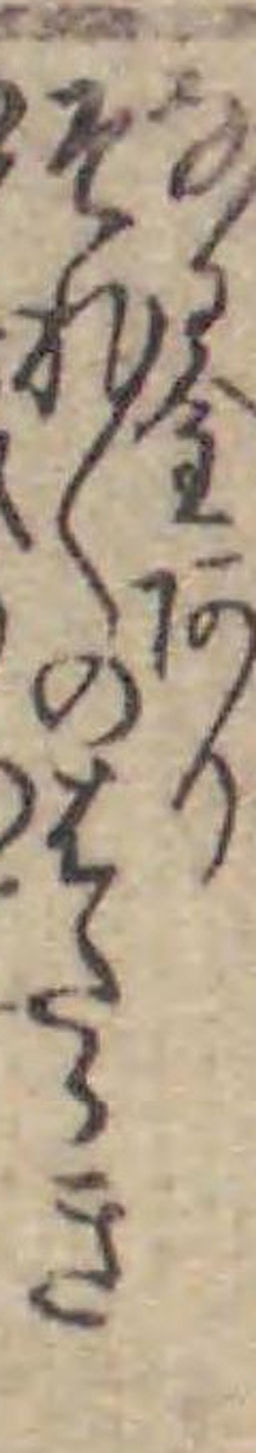それ〳〵のはたらき
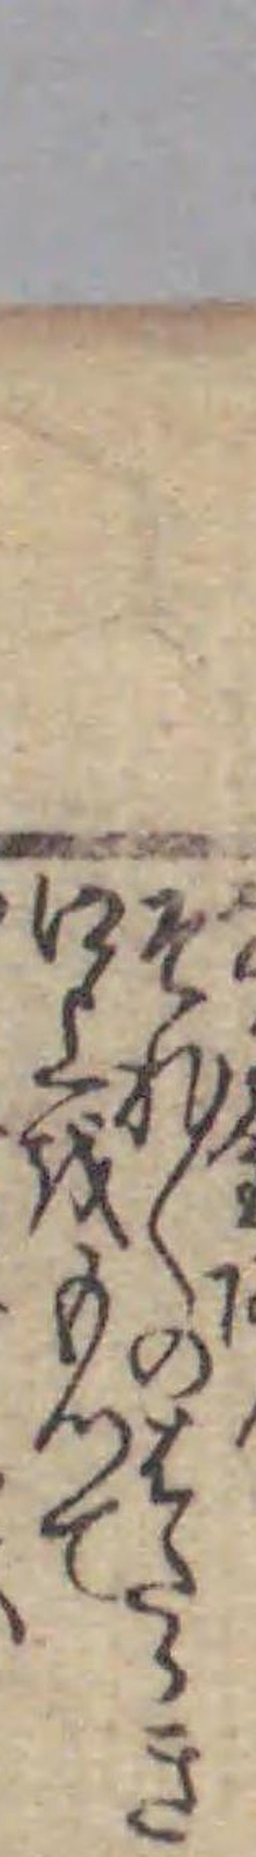口上をもつて
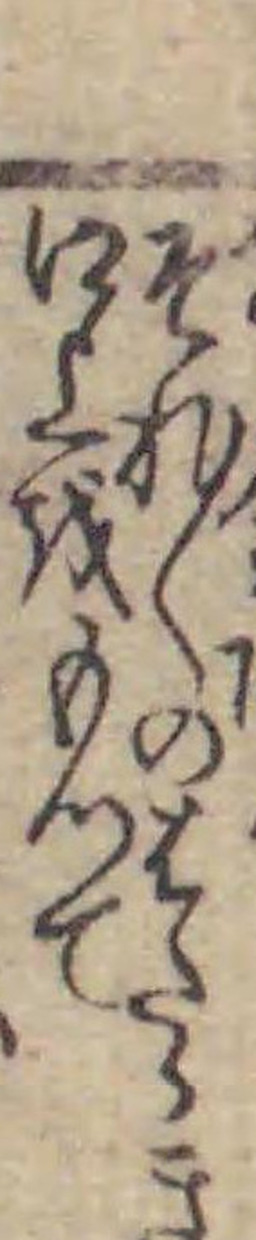口上をもつて
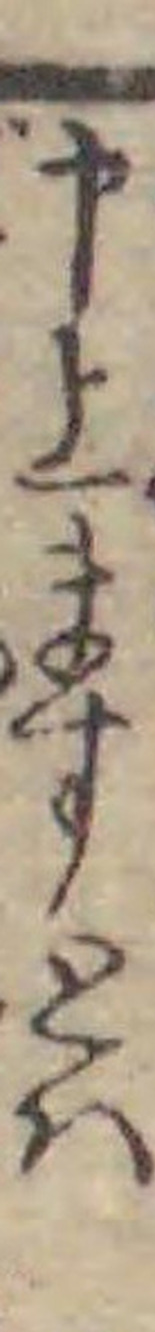申上ますとは
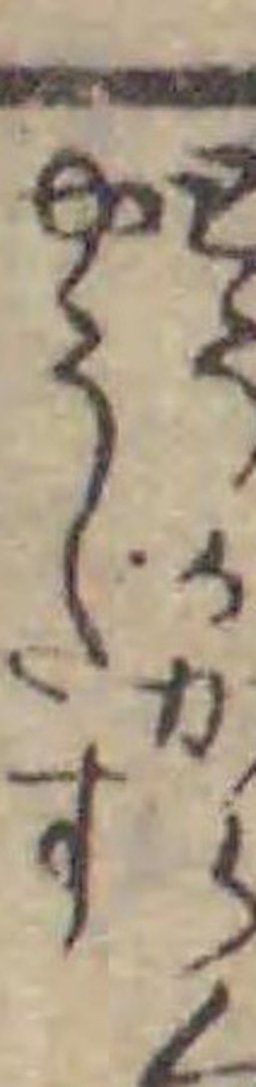やうだす
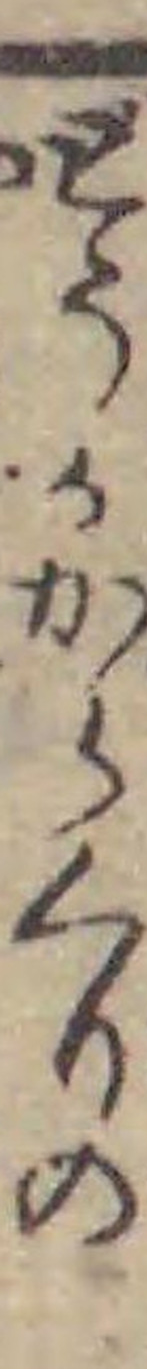どうかからくりの

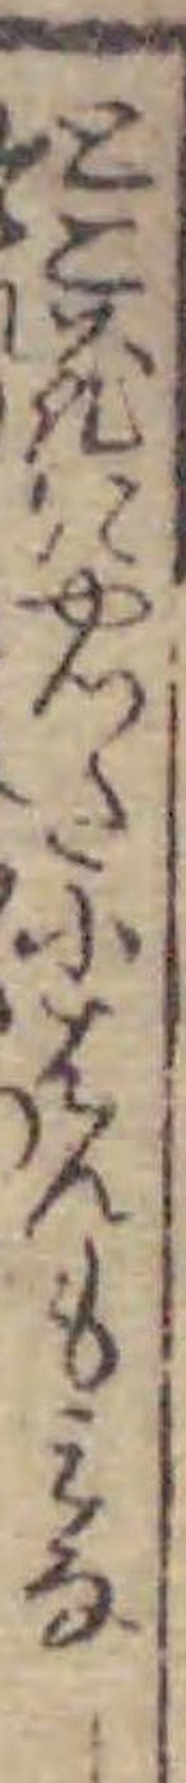とこ花にやつた小はんもみな
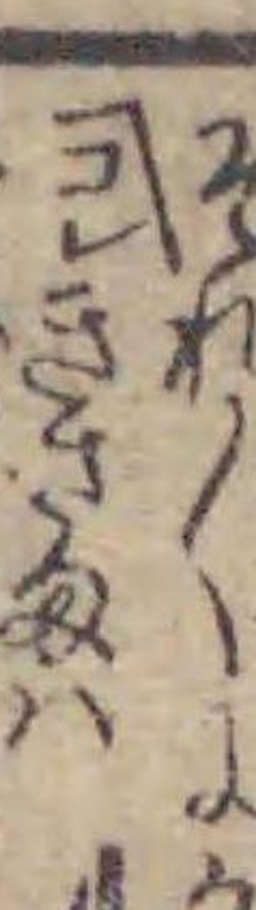〽コレきさまは
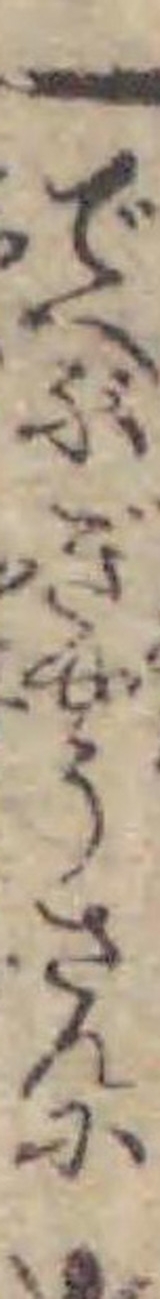でへぶぎやうさんに
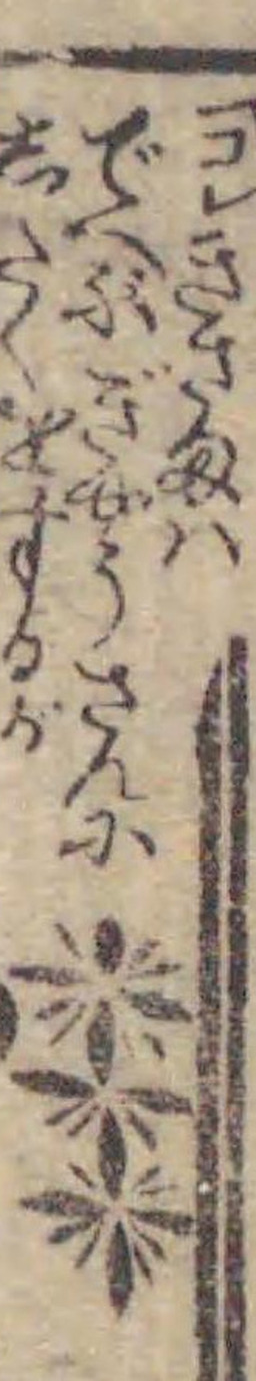でへぶぎやうさんに
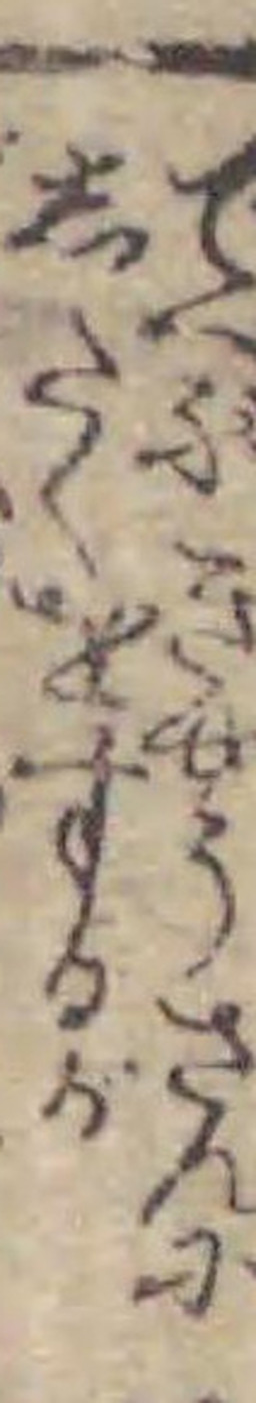したくをするが
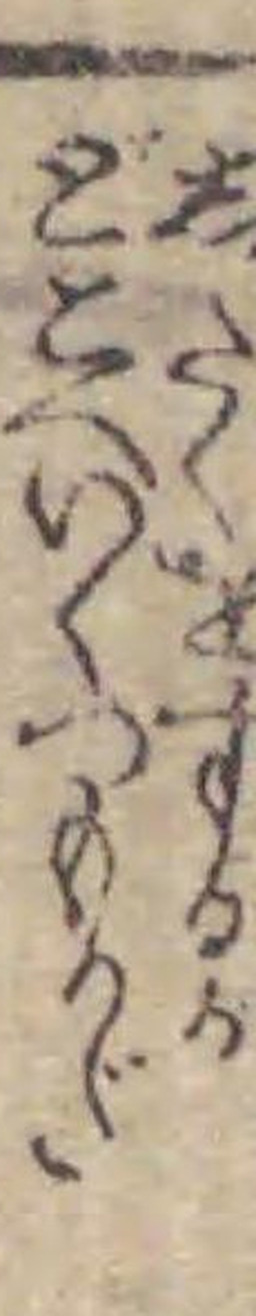どこへいくつもりかだ
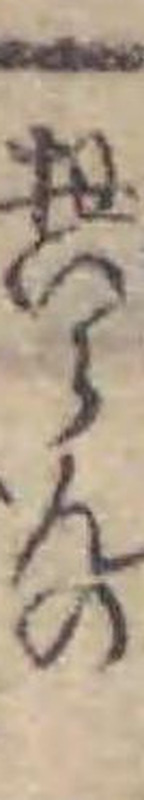おいらんの
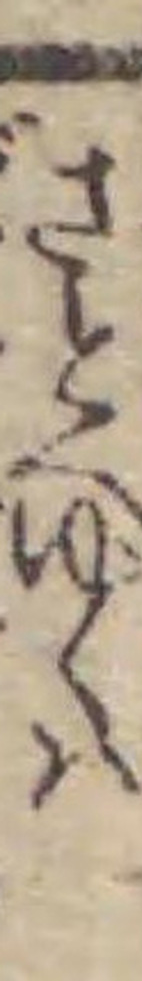さとへゆくは
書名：新鋳小判 : 3巻
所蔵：国立国会図書館 National Diet Library, JAPAN
